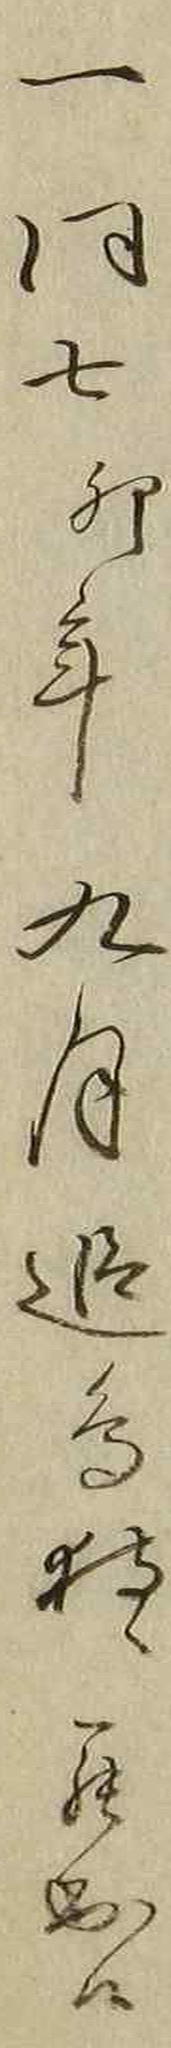一同七卯年九月追鳥狩へ罷出候
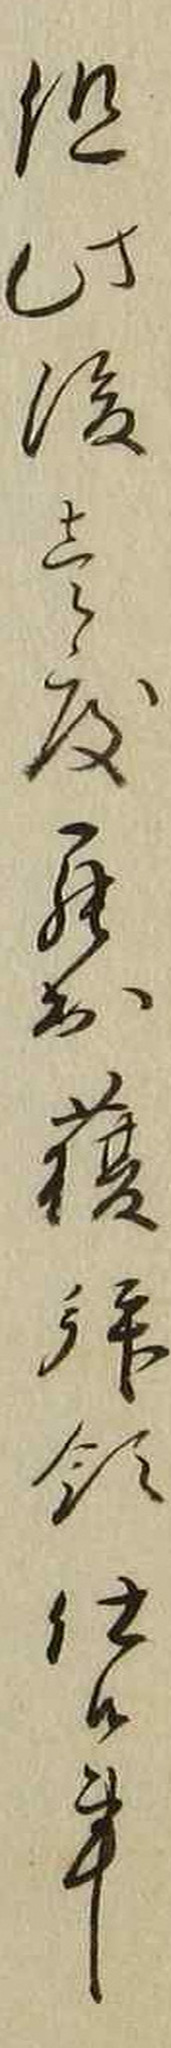但此後壱度罷出獲拝領仕候事
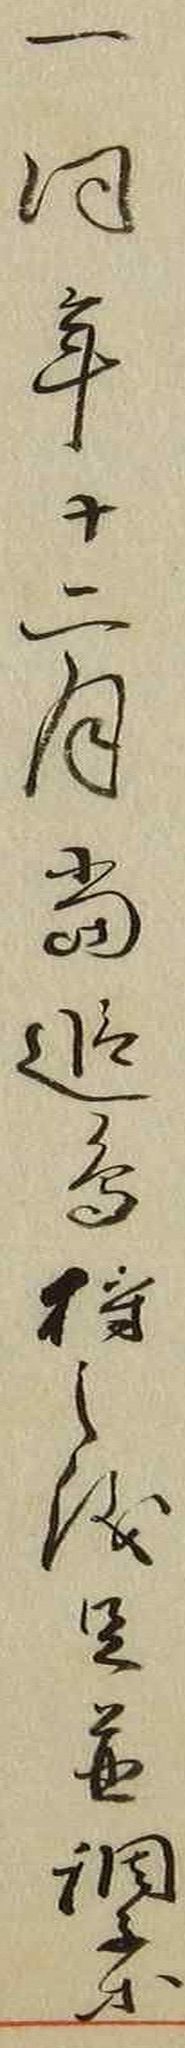一同年十二月当追鳥狩之儀足並調子等
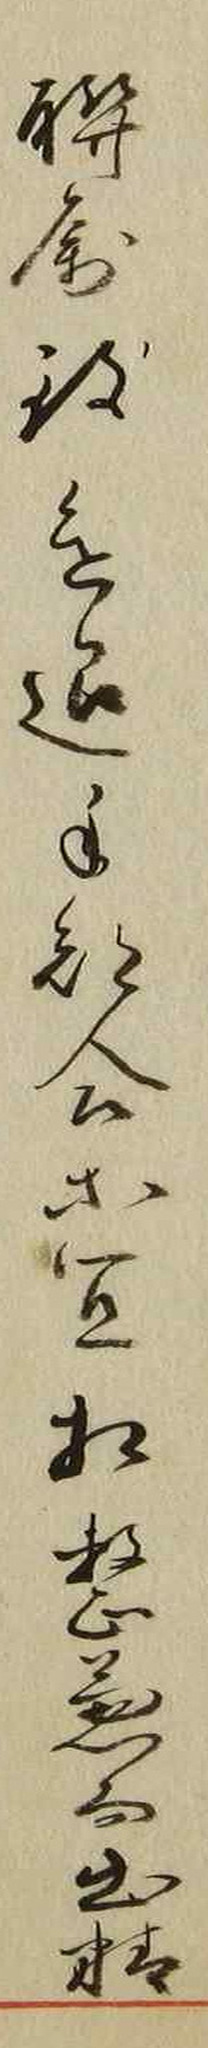属致鳥追手都合等宜相整兼而出精
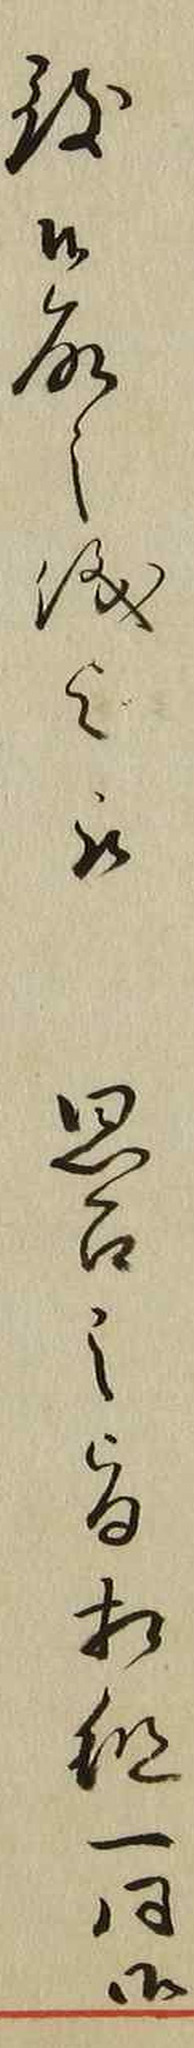致候故之儀と被思召之旨相組一同御
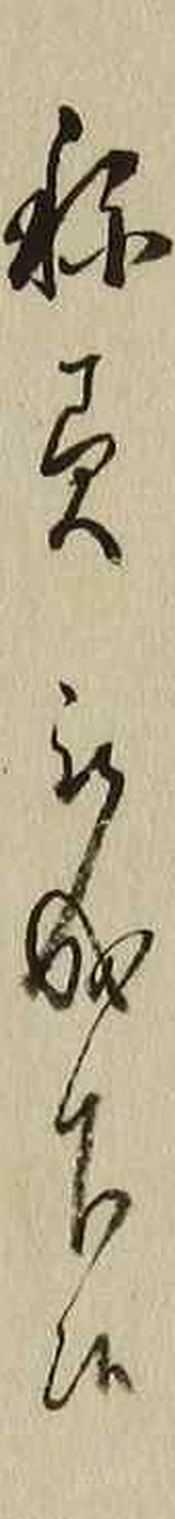称美被成下候
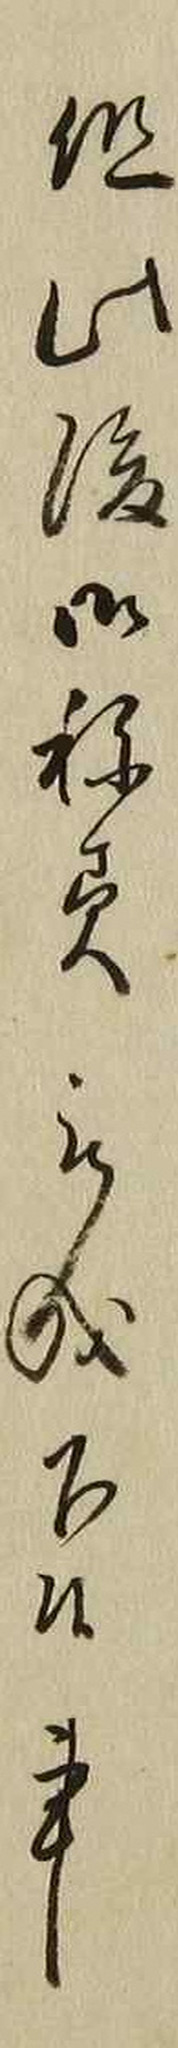但此後御称美被成下候事
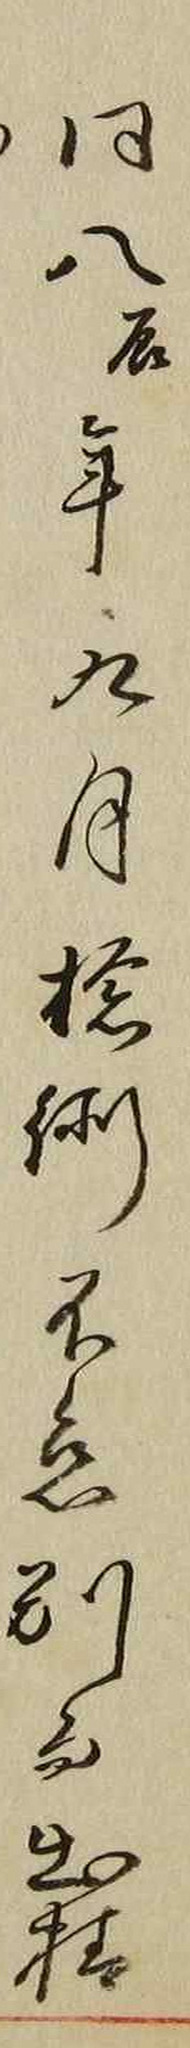一同八辰年九月槍術不怠別而出精
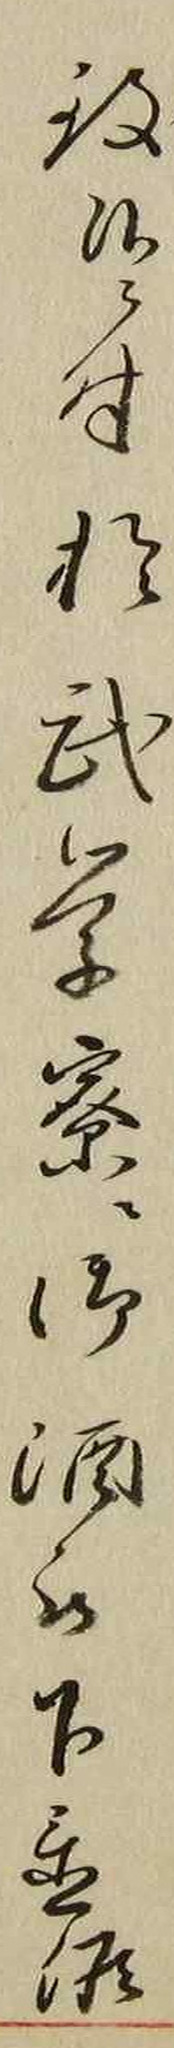致候に付於武学寮に御酒被下置候
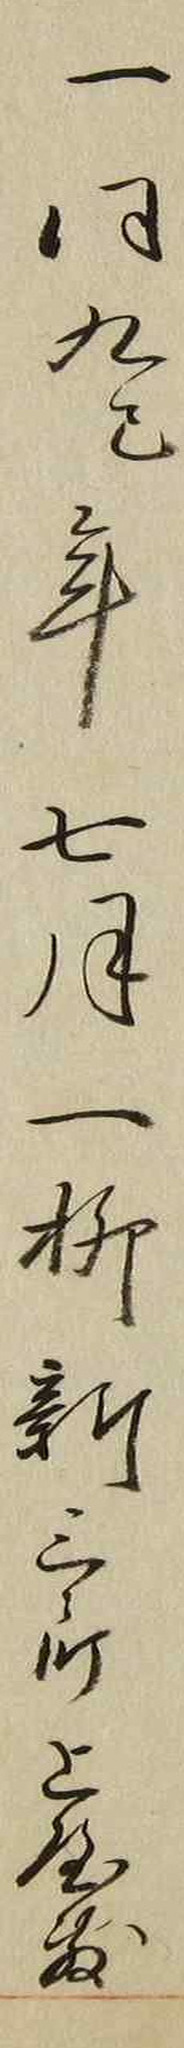一同九巳年七月一柳新三郎上屋敷
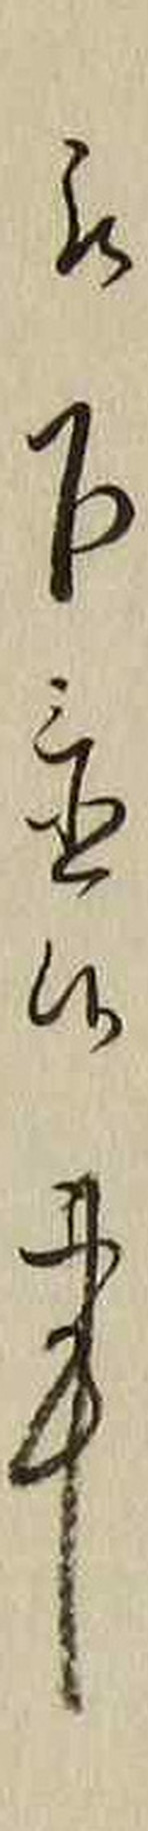被下置候事
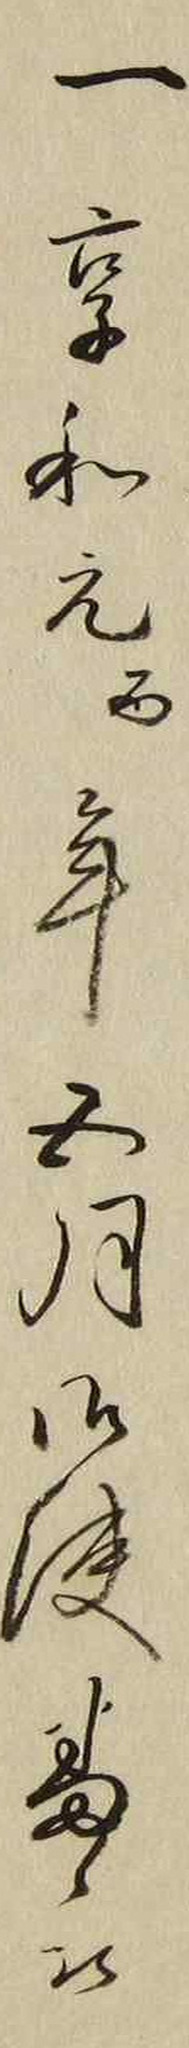一享和元酉年五月御使番被
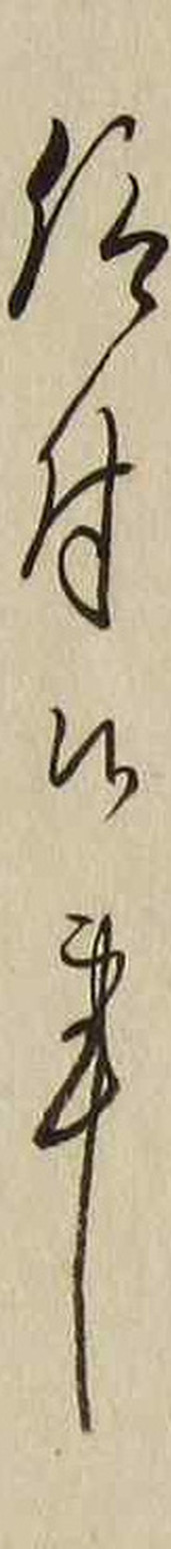仰付候事
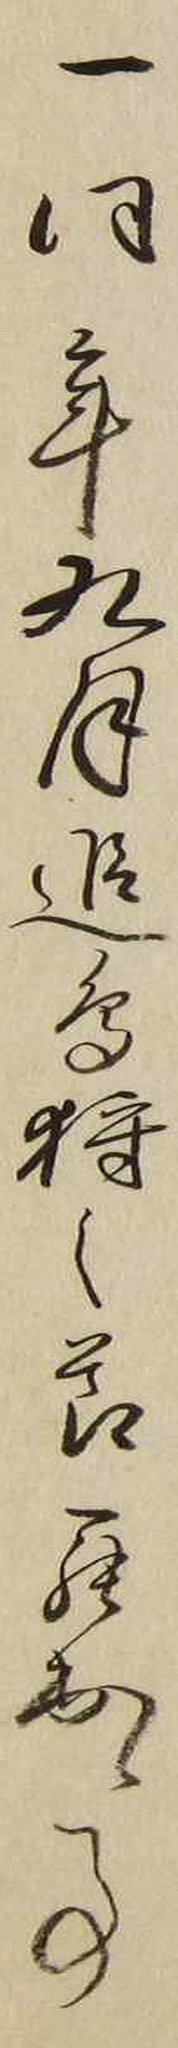一同年九月追鳥狩之節罷出候事

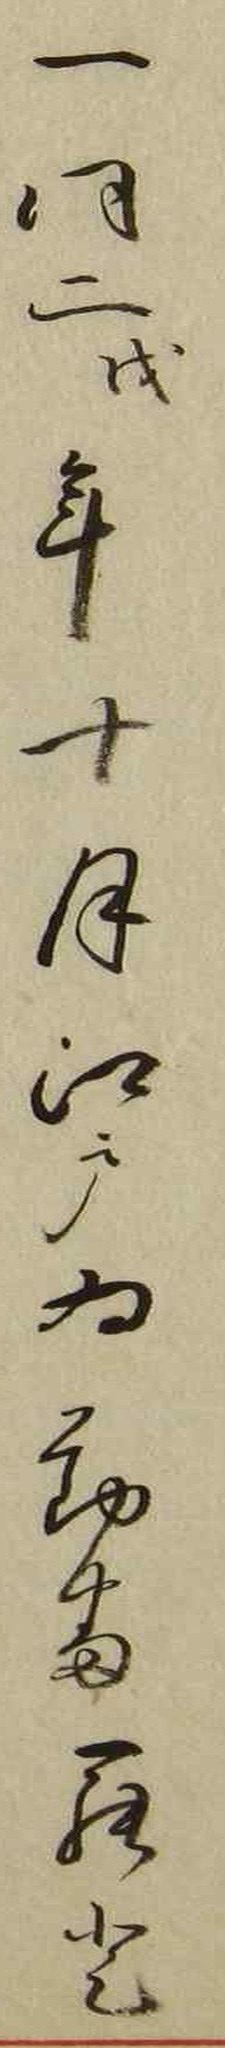一同二戌年十月江戸為勤番罷登
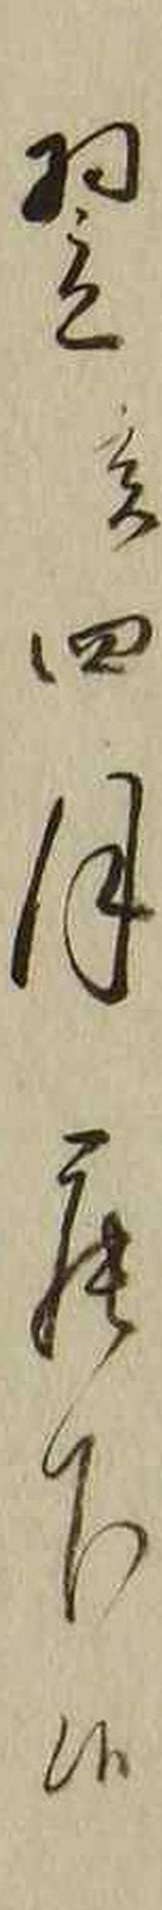翌亥四月罷下候
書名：諸士系譜　巻之1　い之部1
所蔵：会津若松市立会津図書館
